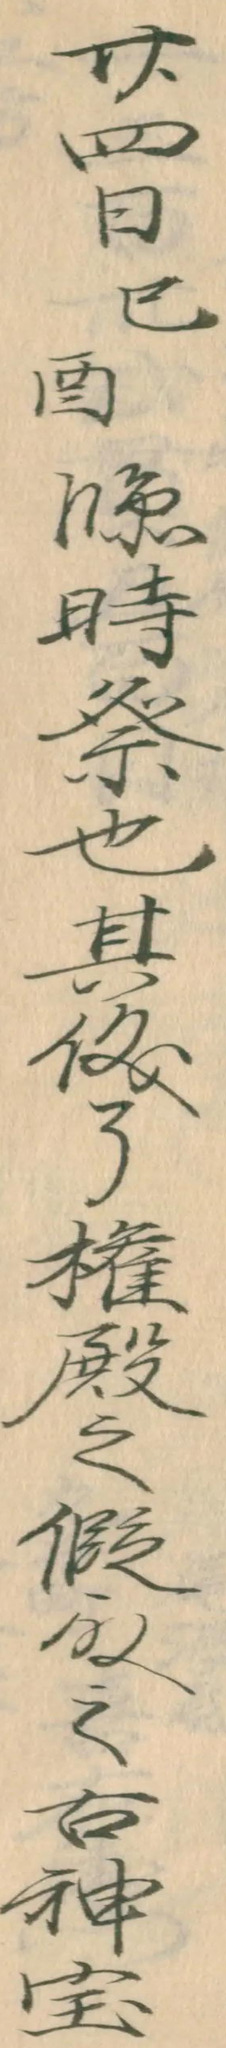廿四日己酉臨時祭也其儀了権殿之仮殿之古神宝
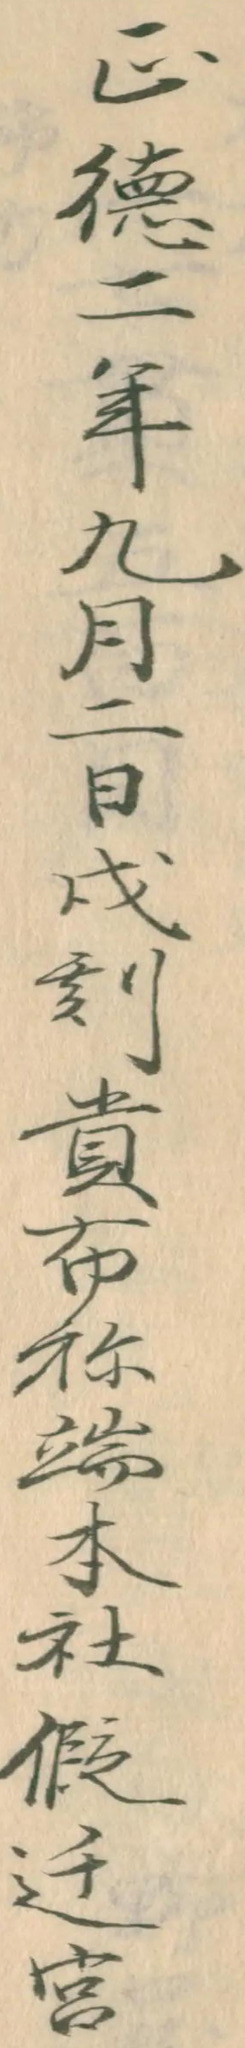正徳二年九月二日戌刻貴布祢端本社仮迁宮
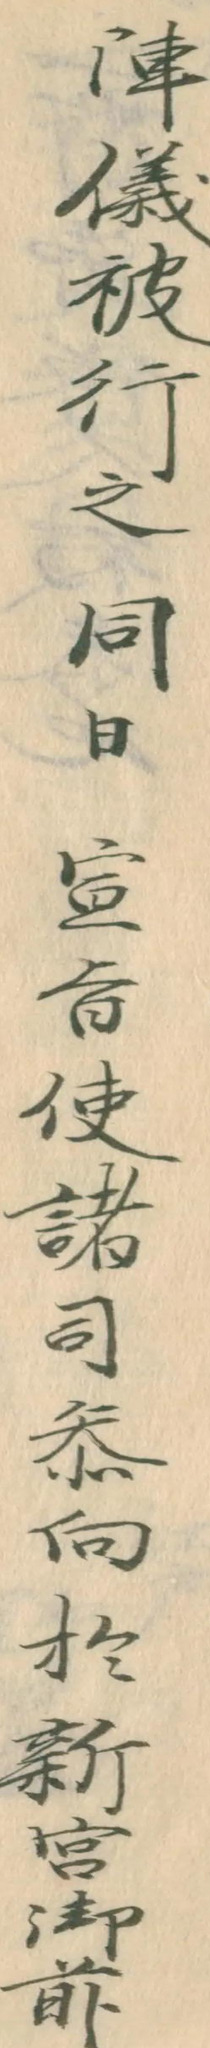陣儀被行之同日宣旨使諸司参向於新宮御前
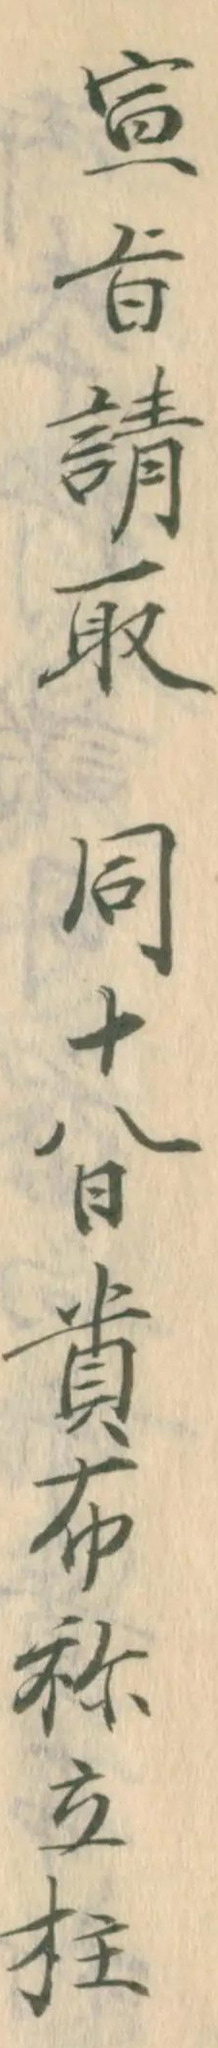宣旨請取同十八日貴布祢立柱
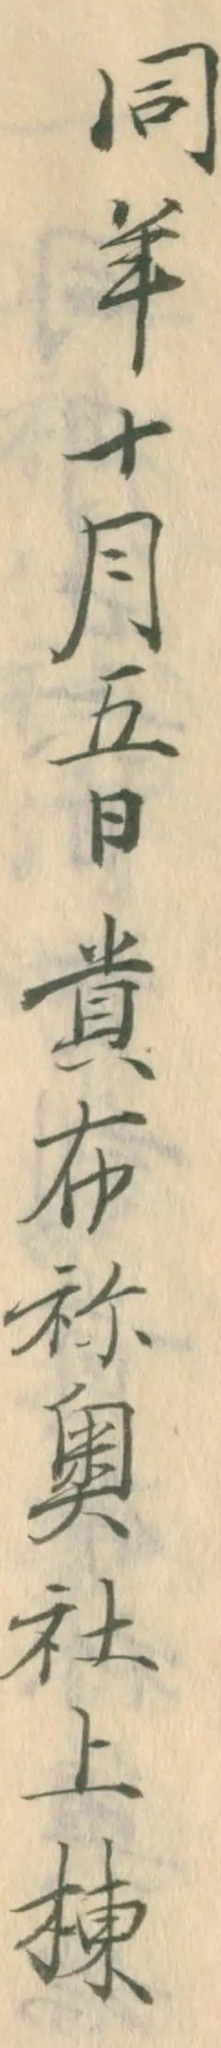同年十月五日貴布祢奥社上棟
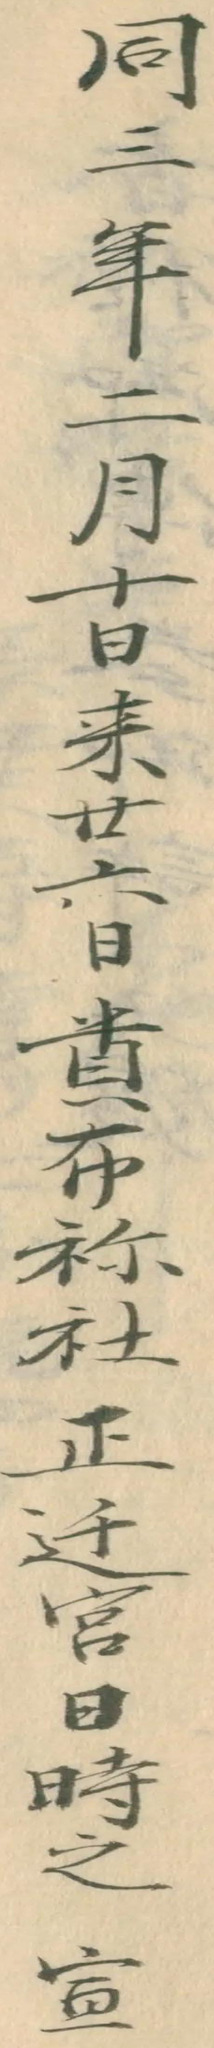同三年二月十日来廿六日貴布祢正迁宮日時之宣

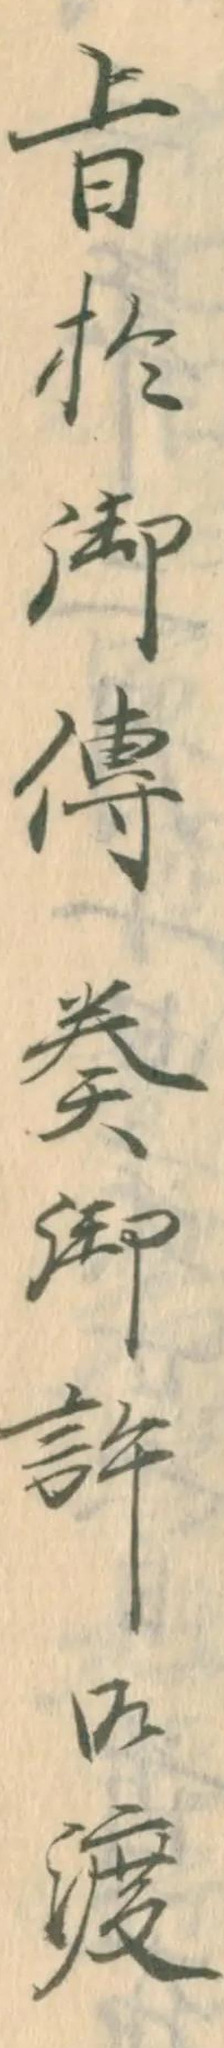旨於御伝奏御許御渡
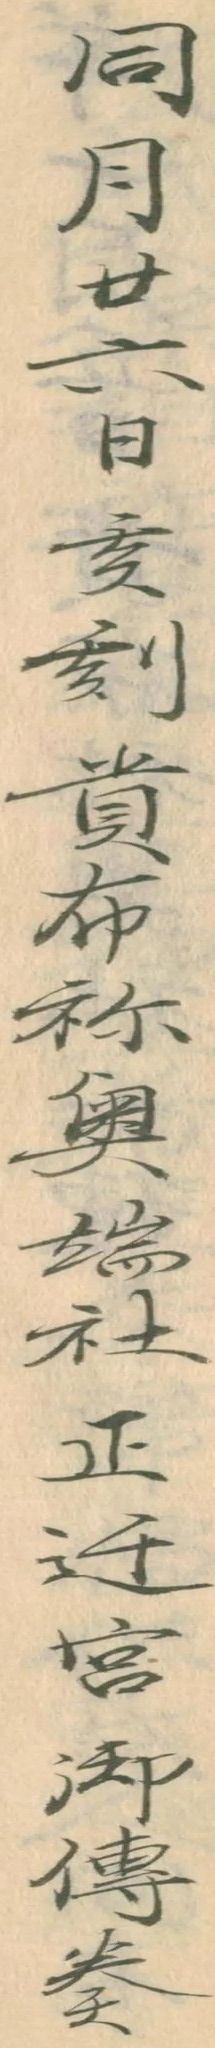同月廿六日亥刻貴布祢奥端社正迁宮御伝奏
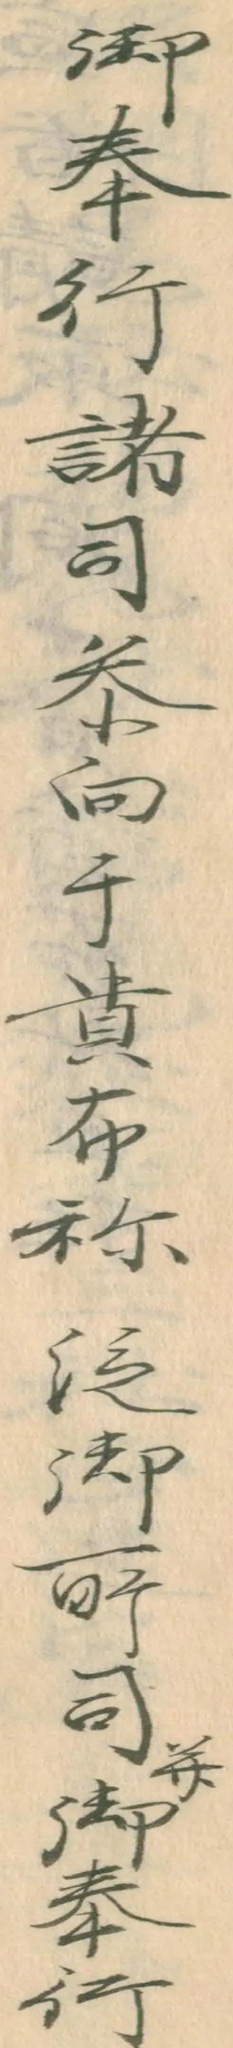御奉行諸司参向于貴布祢従御所司御奉行
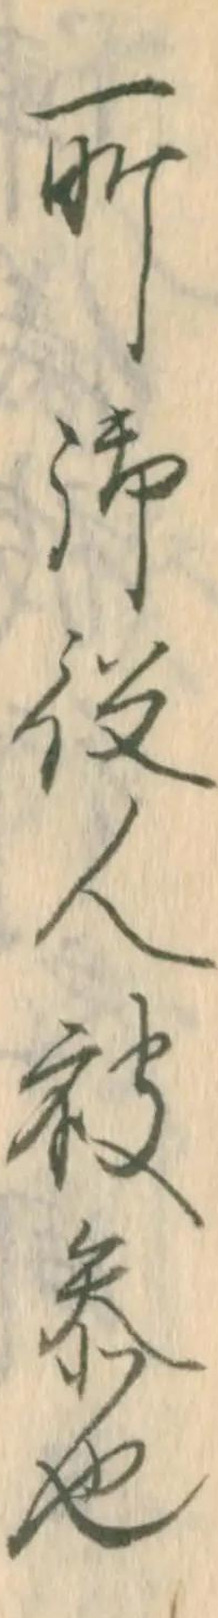所御役人被参也
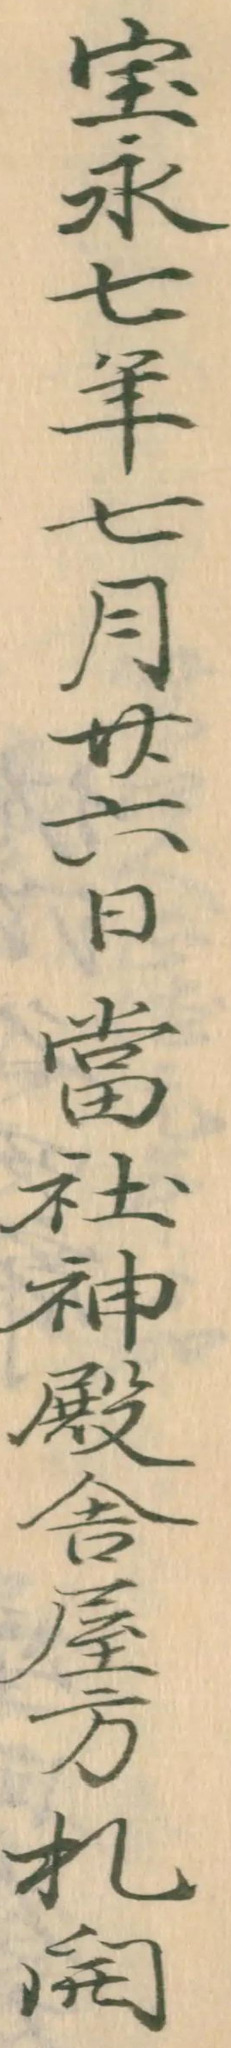宝永七年七月廿六日当社神殿舎屋方札開
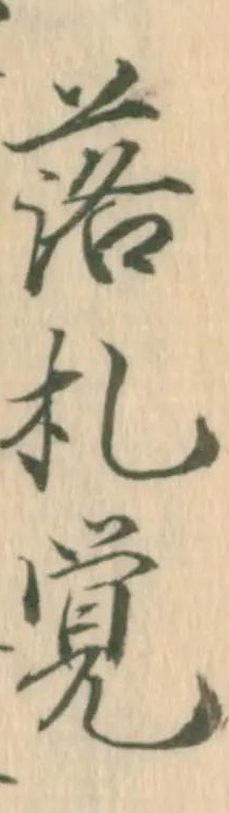落札覚
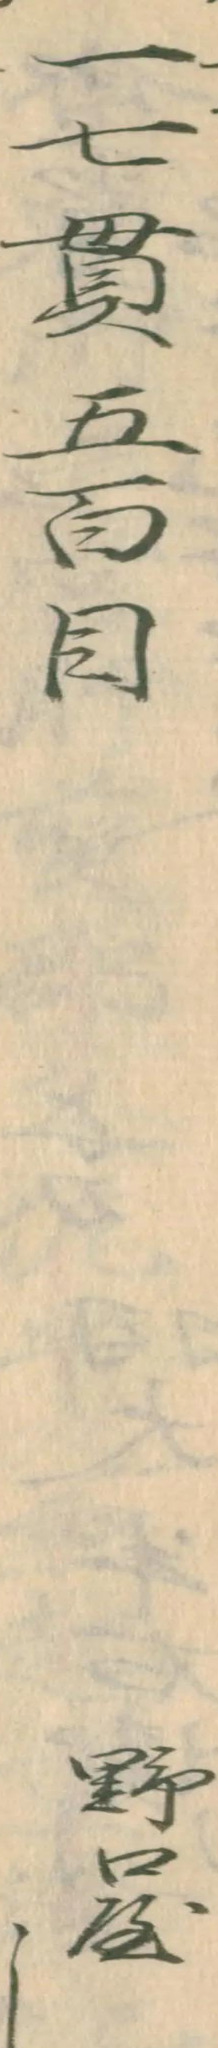一七貫五百目野口屋
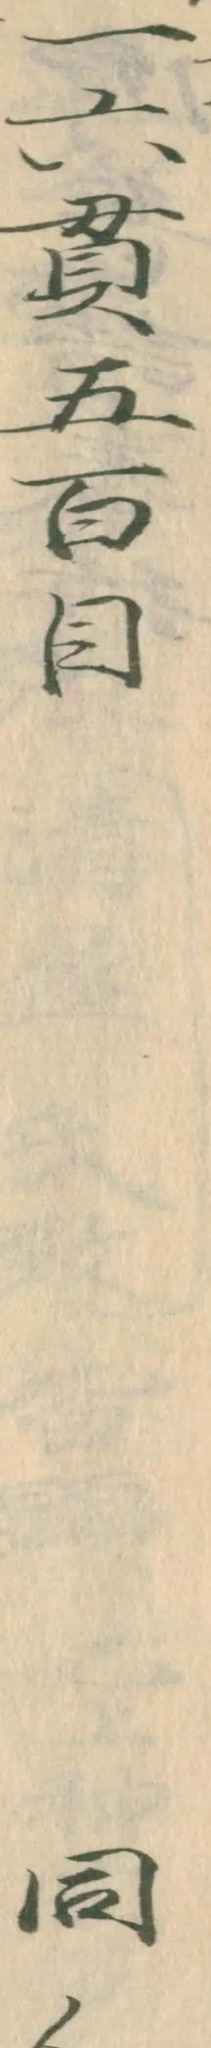一六貫五百目同人
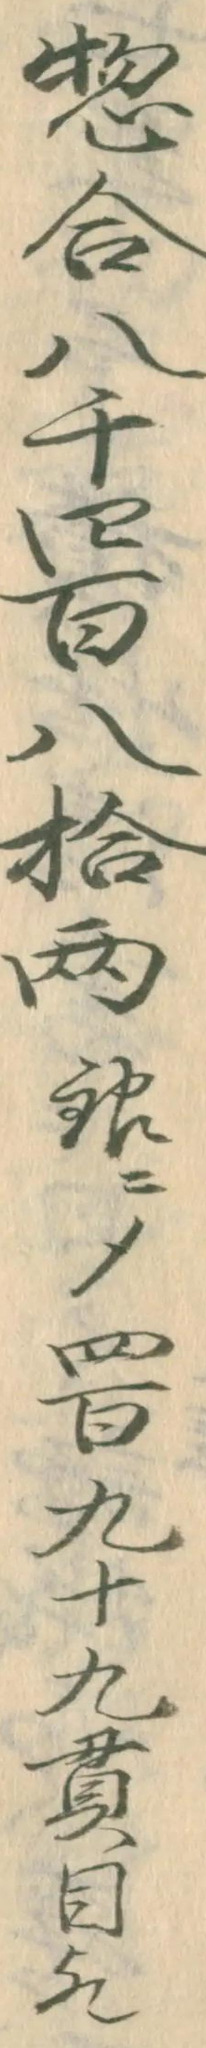惣合八千四百八拾両銀ニシテ四百九十九貫目歟
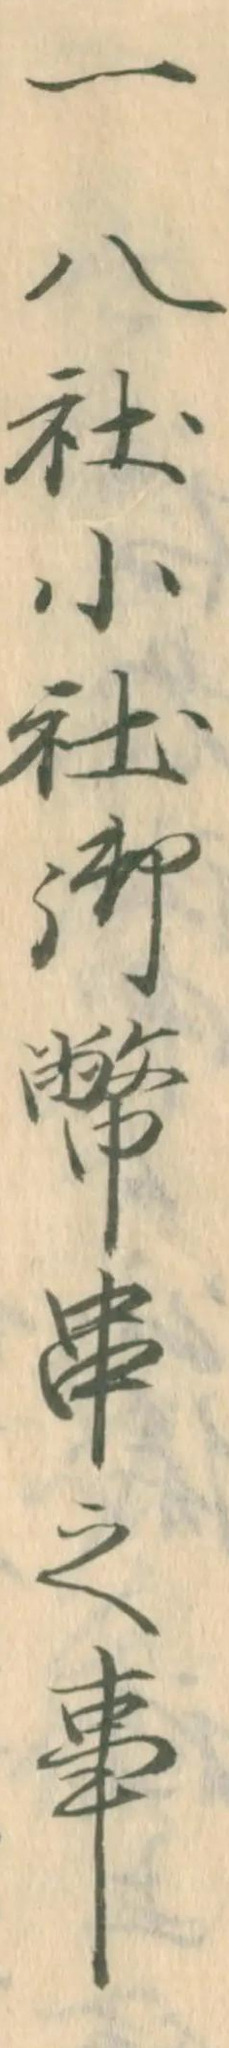一八社小社御幣串之事
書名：賀茂社記録. 第15冊
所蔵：国立国会図書館 National Diet Library, JAPAN
